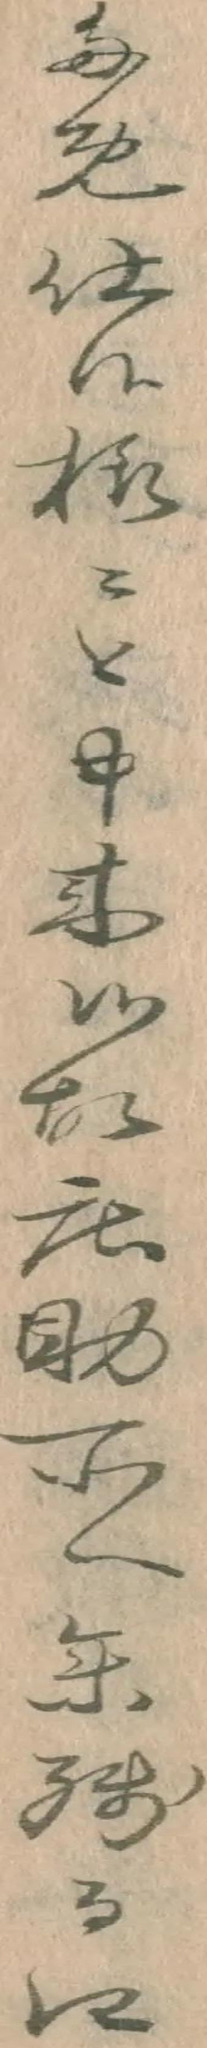多免仕候様にと申来候故庄助所へ参残る四
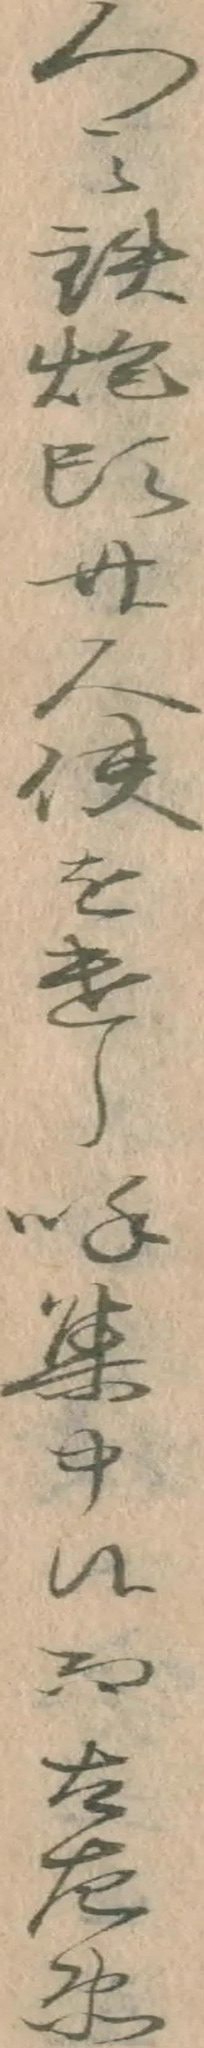人之鉄炮頭廿人使を遣し呼集申候而太左衛
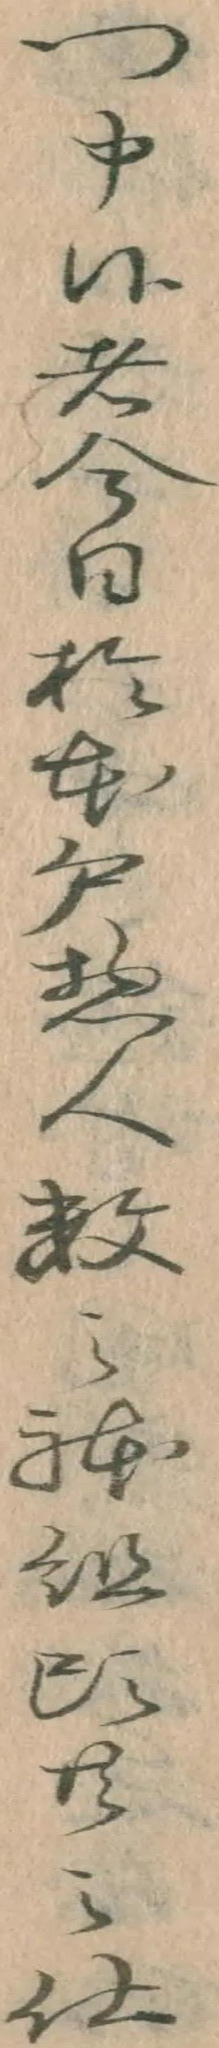門申候者今日於本戸惣人数之躰組頭共之仕
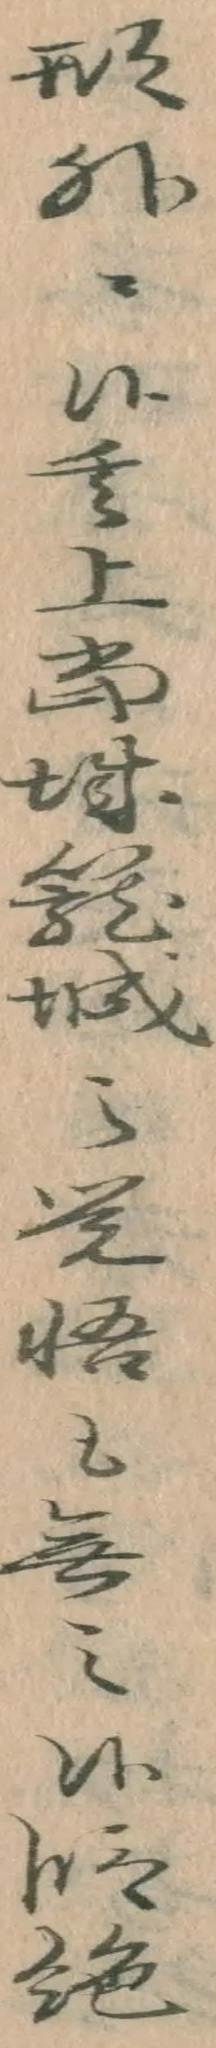形外に候其上当城籠城之覚悟も無之候段絶
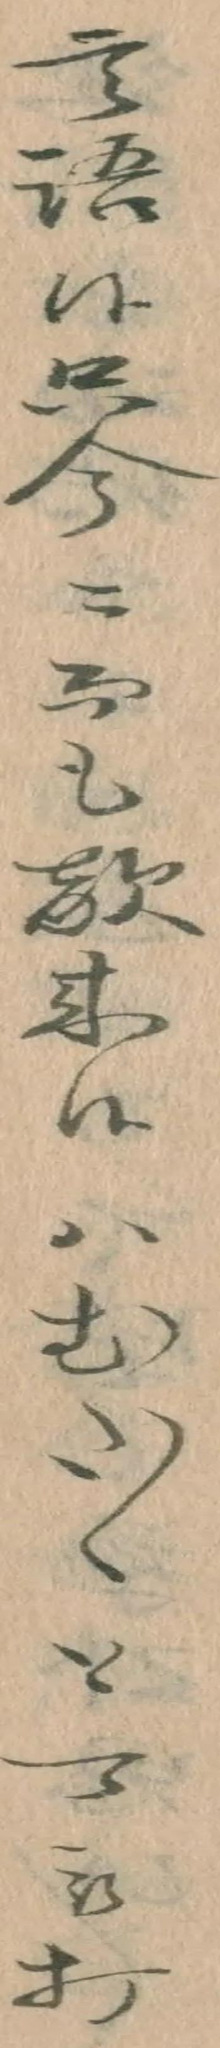言語候只今に而も敵来候はむだ〱と可被打
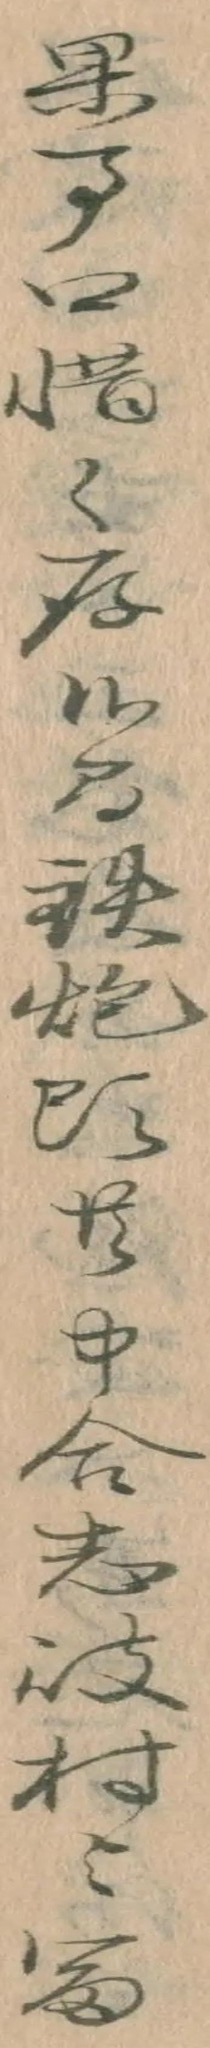果事口惜く存候間鉄炮頭共申合志彼村与冨
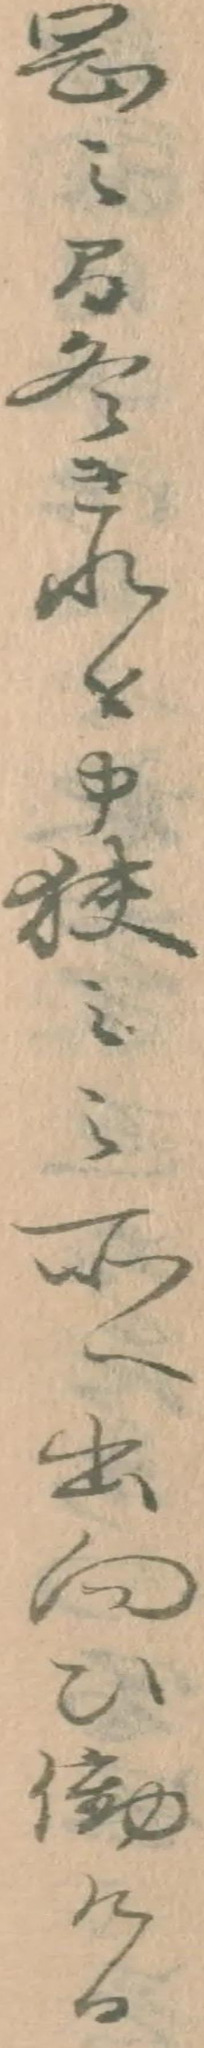岡之間冬きれと申狭み之所へ出向ひ働ける
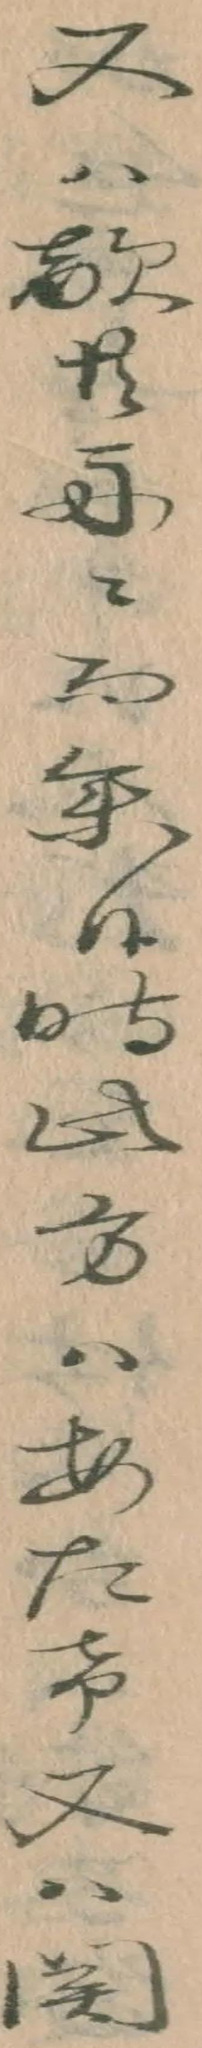又は敵共舟に而参候時此方はあた希又は関
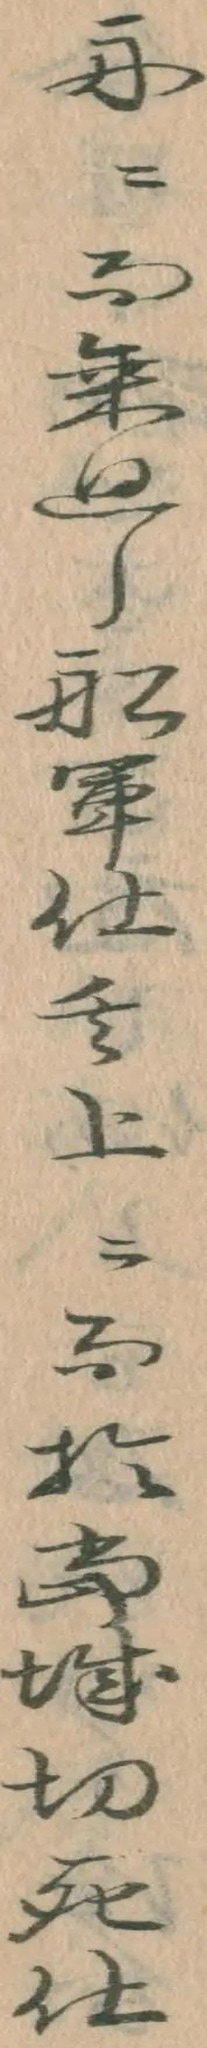舟に而乗廻し舩軍仕其上に而於当城切死仕
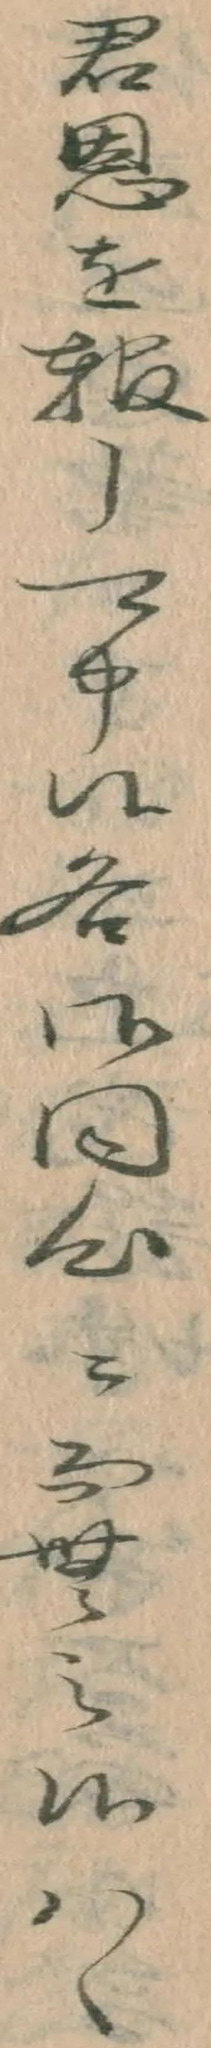君恩を報して申候各御同心に而無之候はゝ
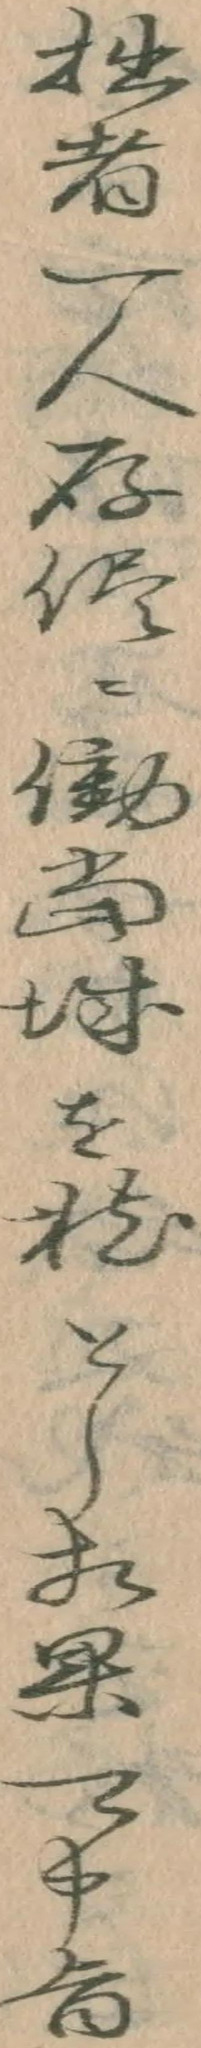拙者一人存侭に働当城を枕とし相果可申旨
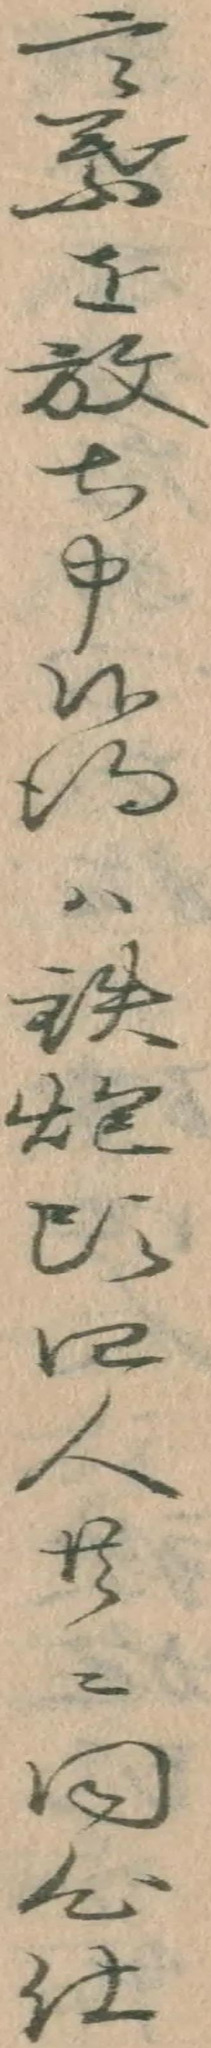言葉を放ち申候得は鉄炮頭四人共に同心仕
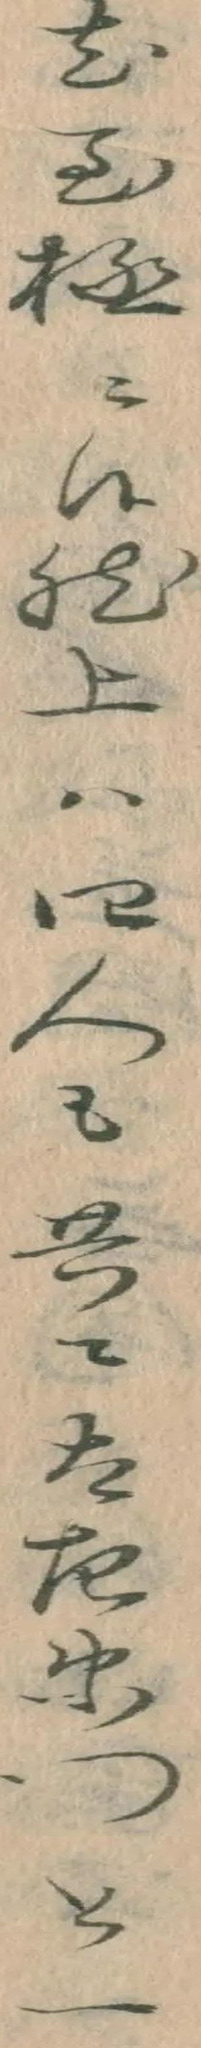尤至極に候然上は四人も共に太左衛門と一
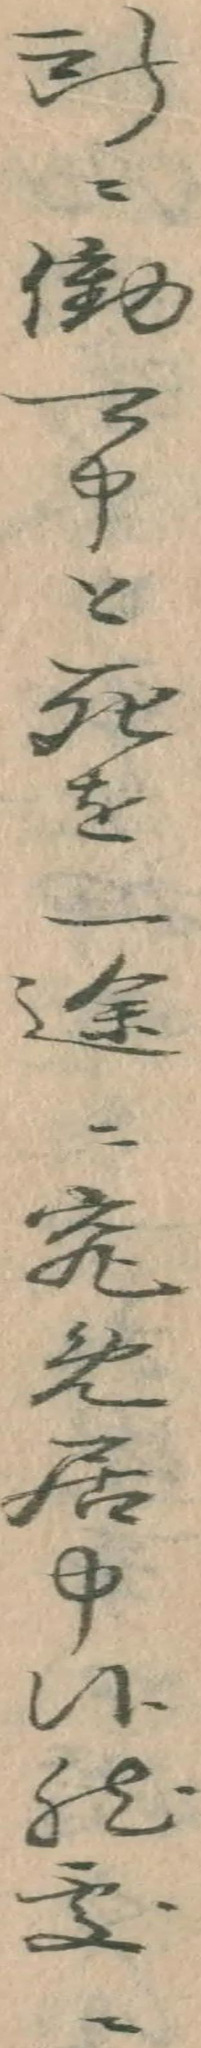所に働可申と死を一途に究免居申候然處に
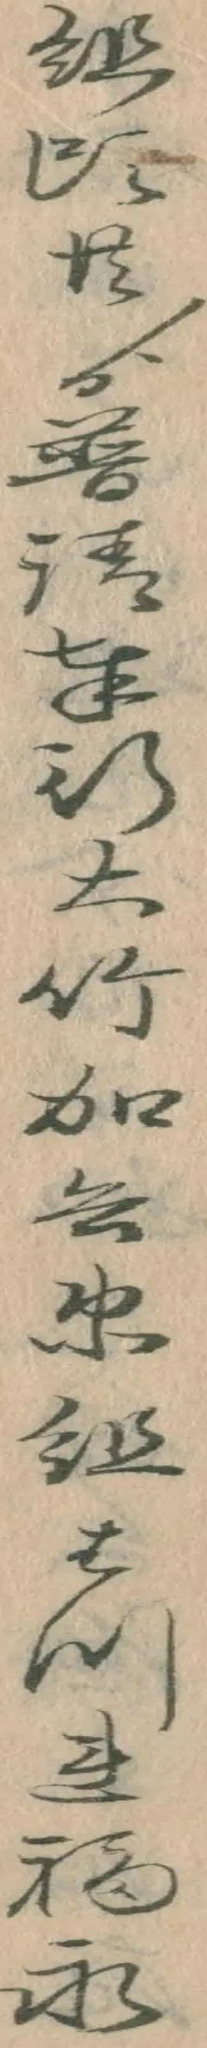組頭共ゟ普請奉行大竹加兵衛組者川連福永
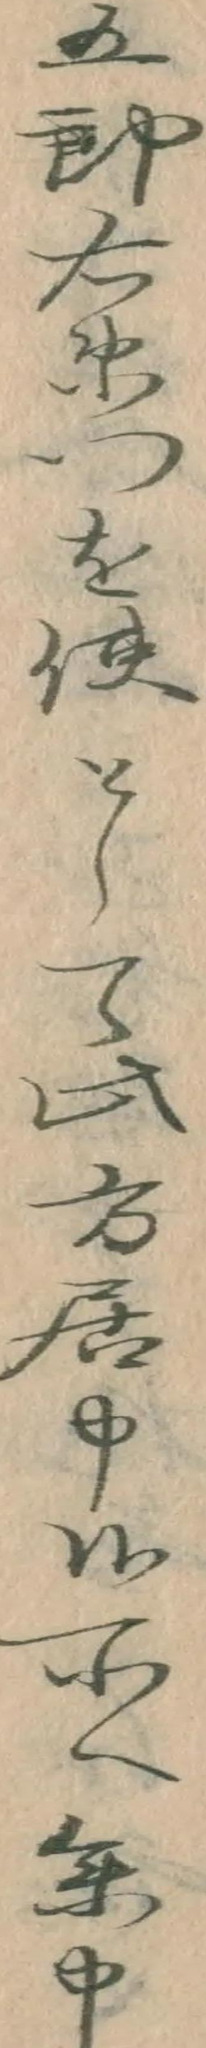五郎右衛門を使として此方居申候所へ参申
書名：切支丹御退治記 49巻. [2]
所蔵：国立国会図書館 National Diet Library, JAPAN
